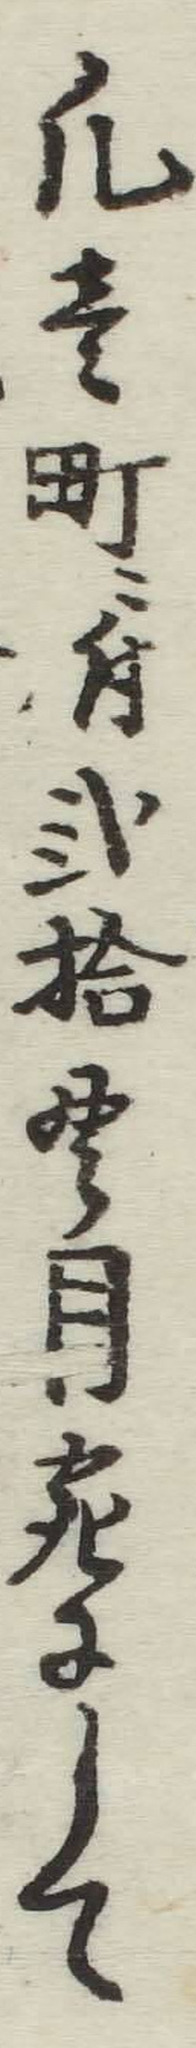凡壱町ニ付弐拾貫目宛にして
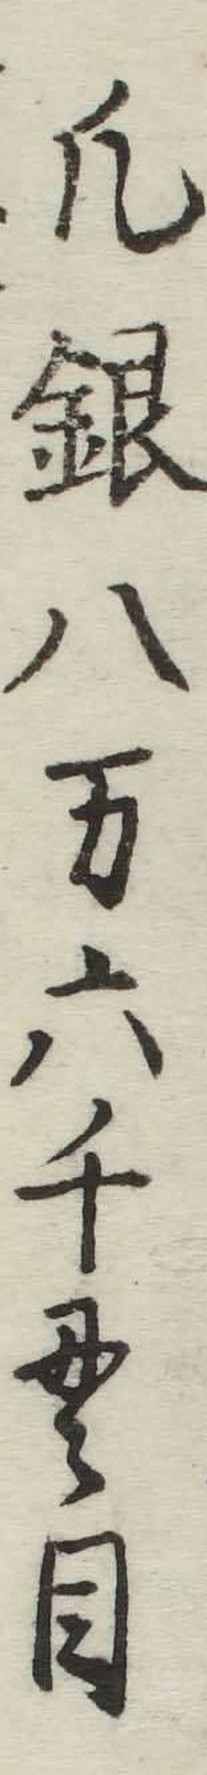凡銀八万六千貫目
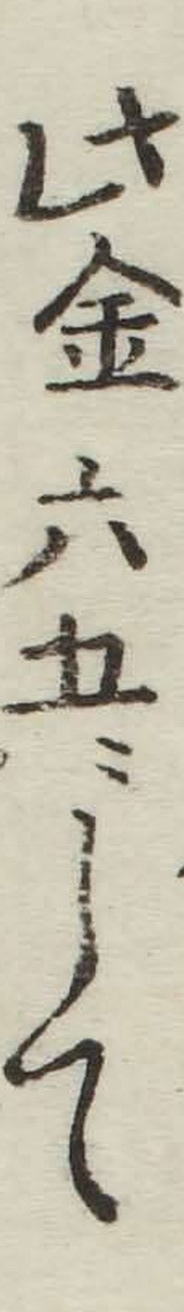此金六五二して
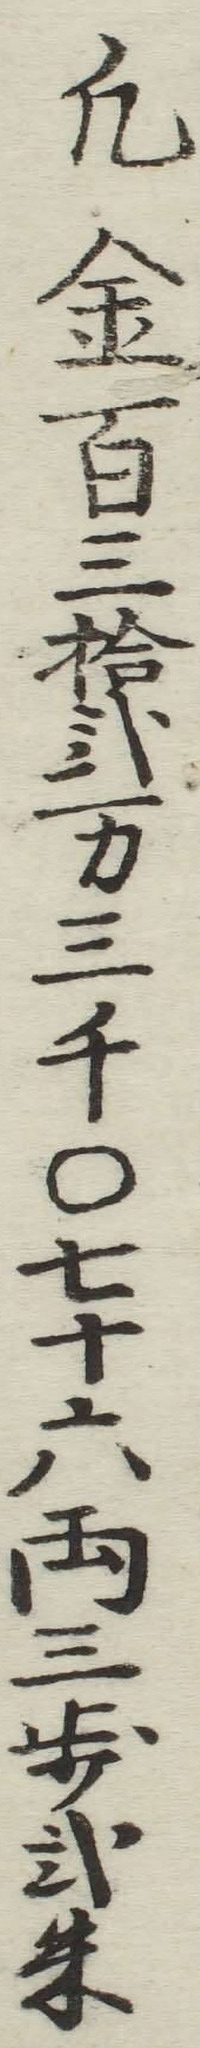凡金百三拾弐万三千○七十六両三歩弐朱
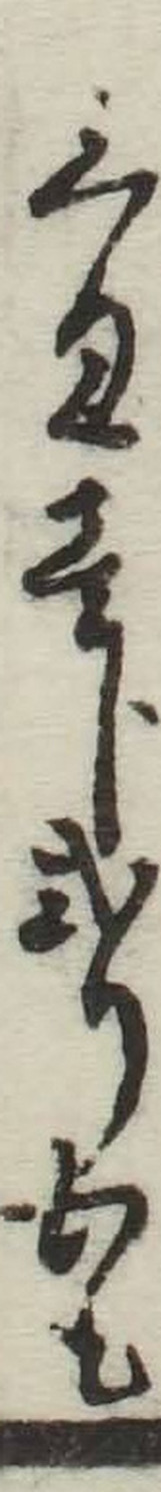三匁壱分二り五も
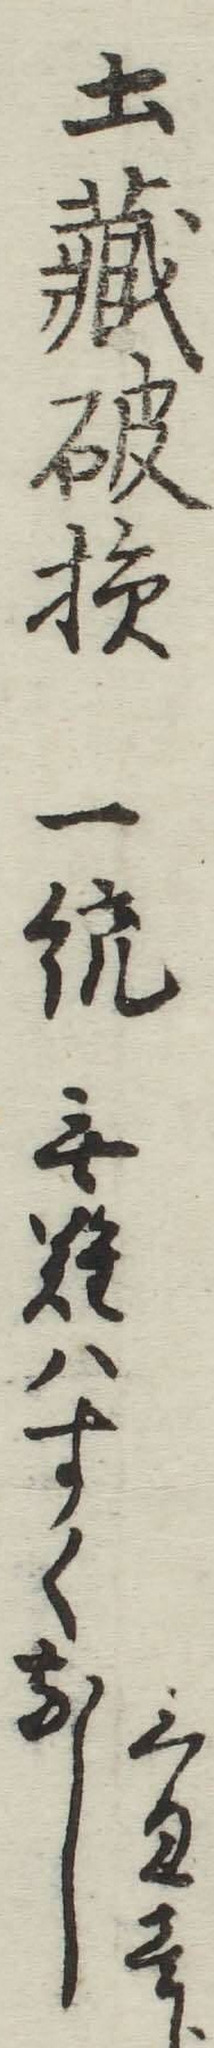土蔵破損一統無難はすくなし
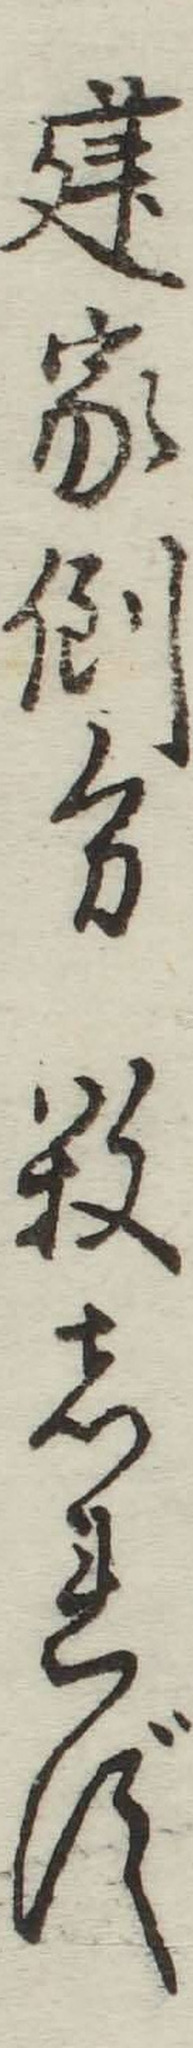建家倒方数しれず
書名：地震奇談／平安万歳楽
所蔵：国文学研究資料館
